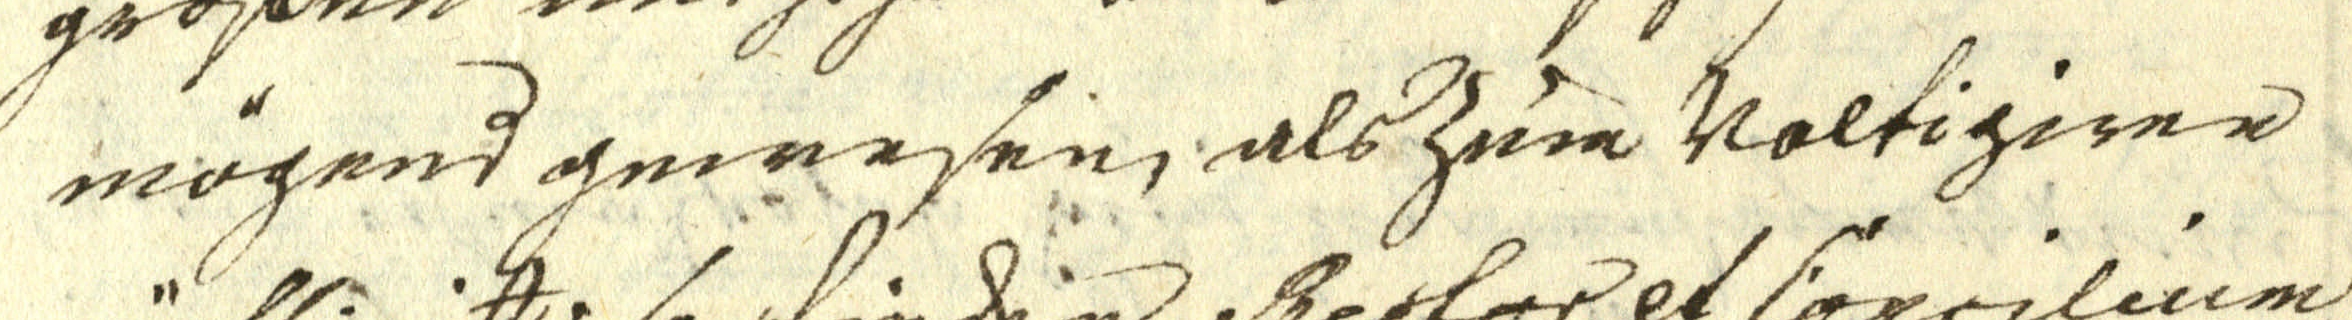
mögend gewesen, als zum Voltigiren
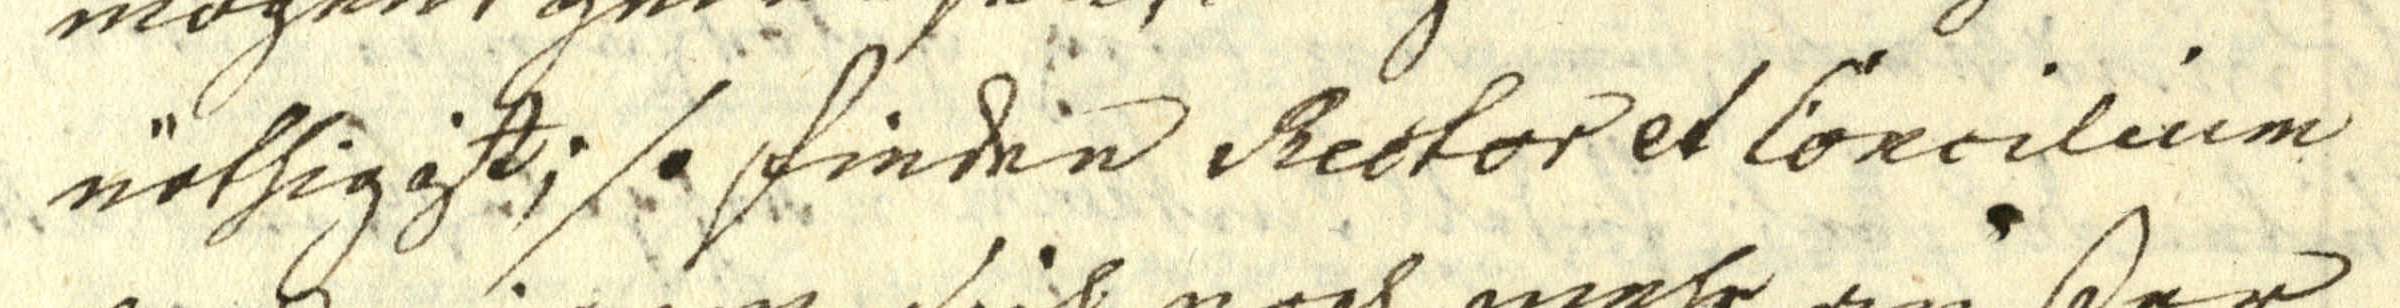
nöthig ist, so finden Rector et Concilium
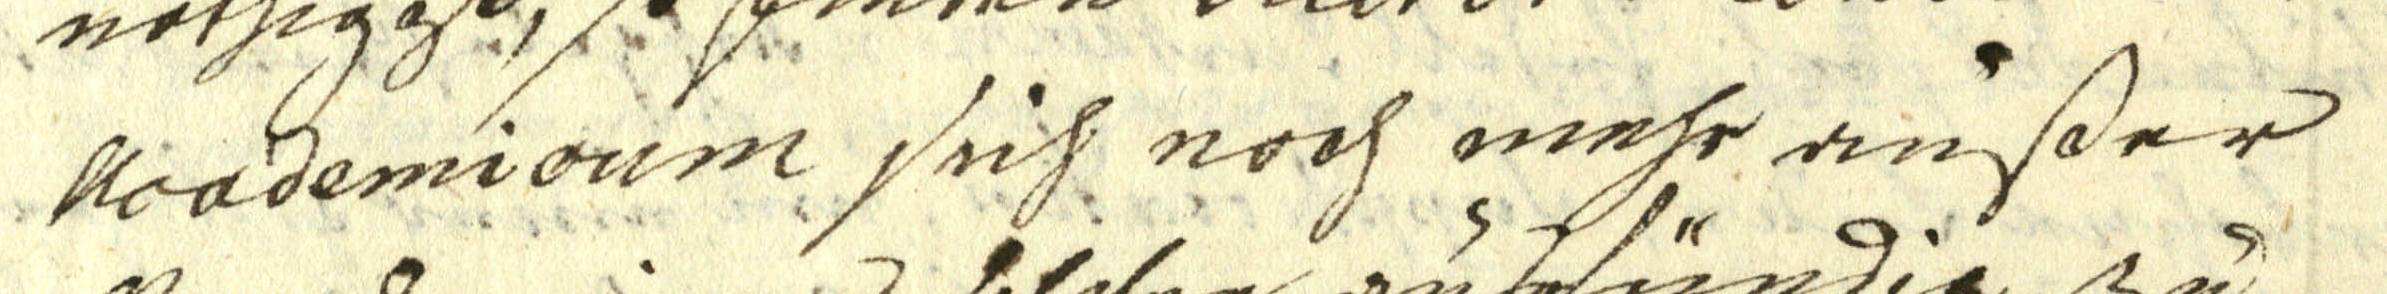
Academicum sich noch mehr außer
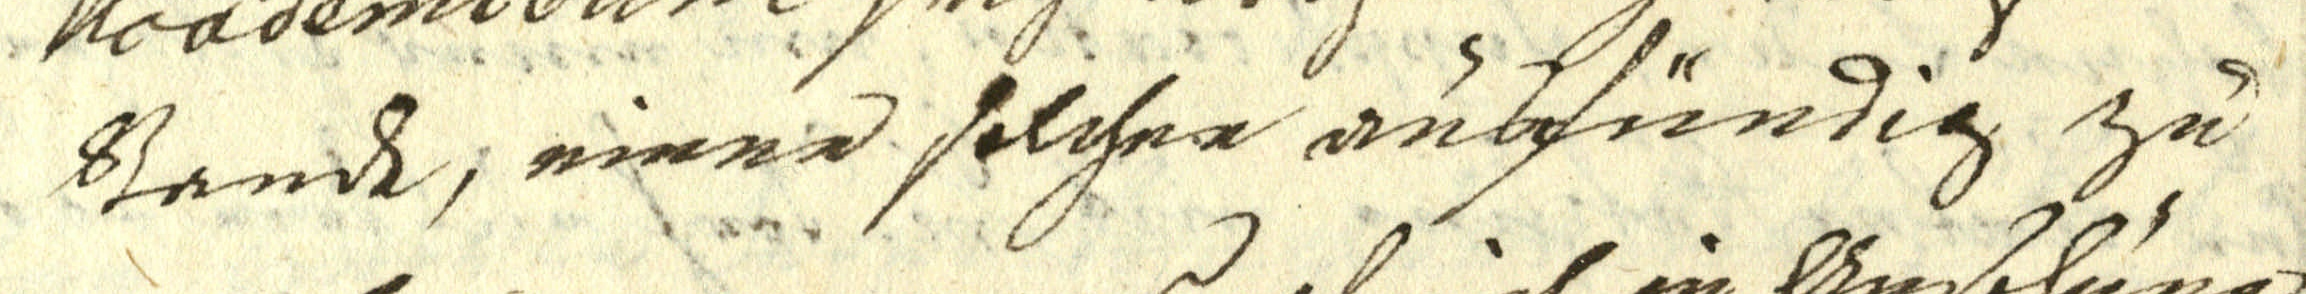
Stande, einen solchen ausfündig zu
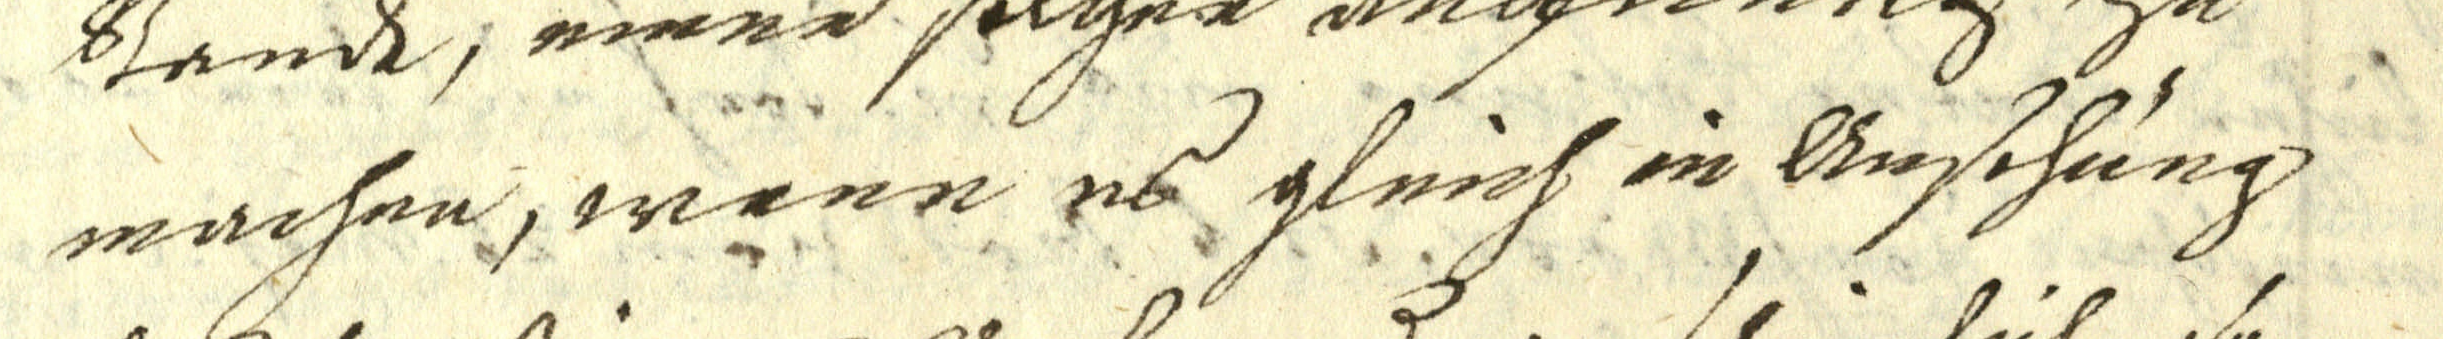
machen, wenn es gleich in Ansehung
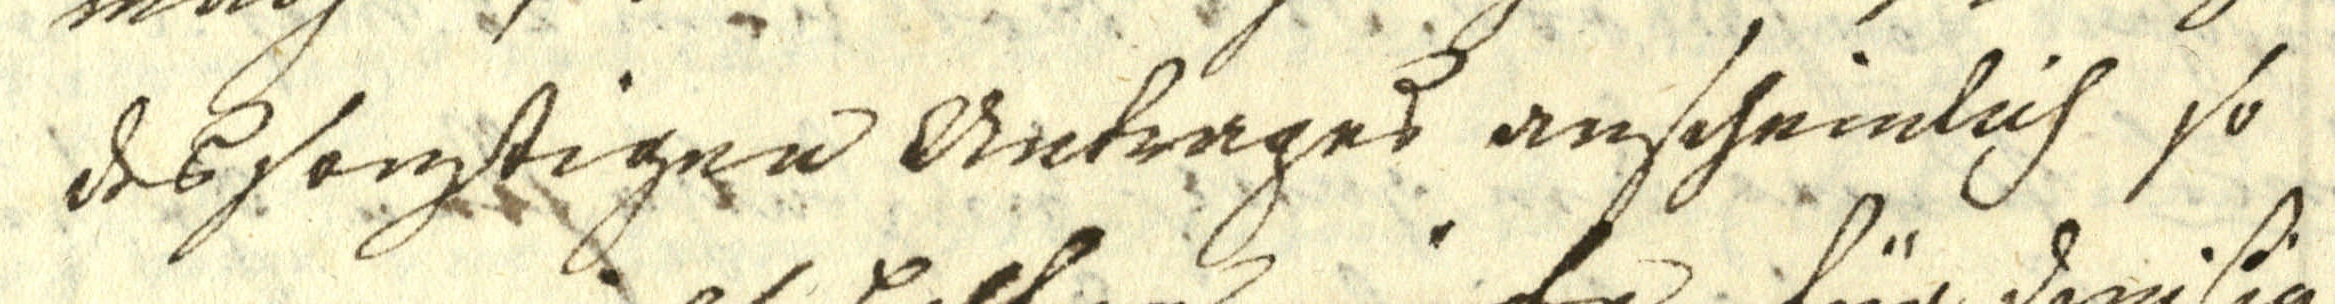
des sonstigen Antrages anscheinlich so
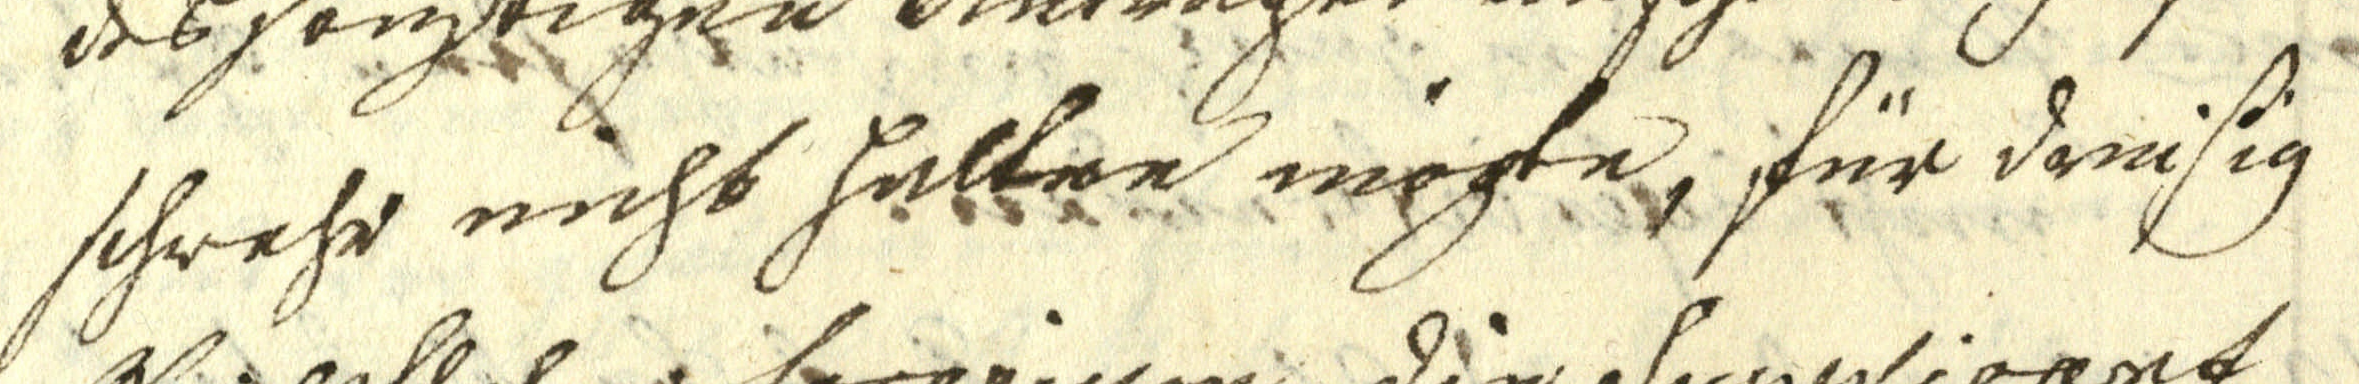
schwehr nicht halten mögte, für dreißig
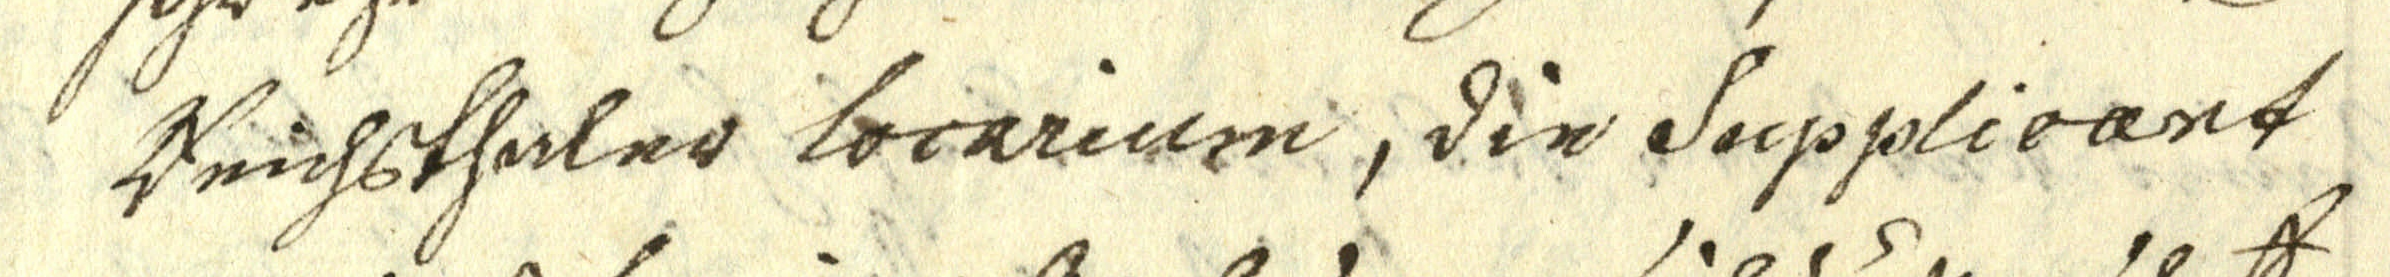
Reichsthaler locarium, die Supplicant
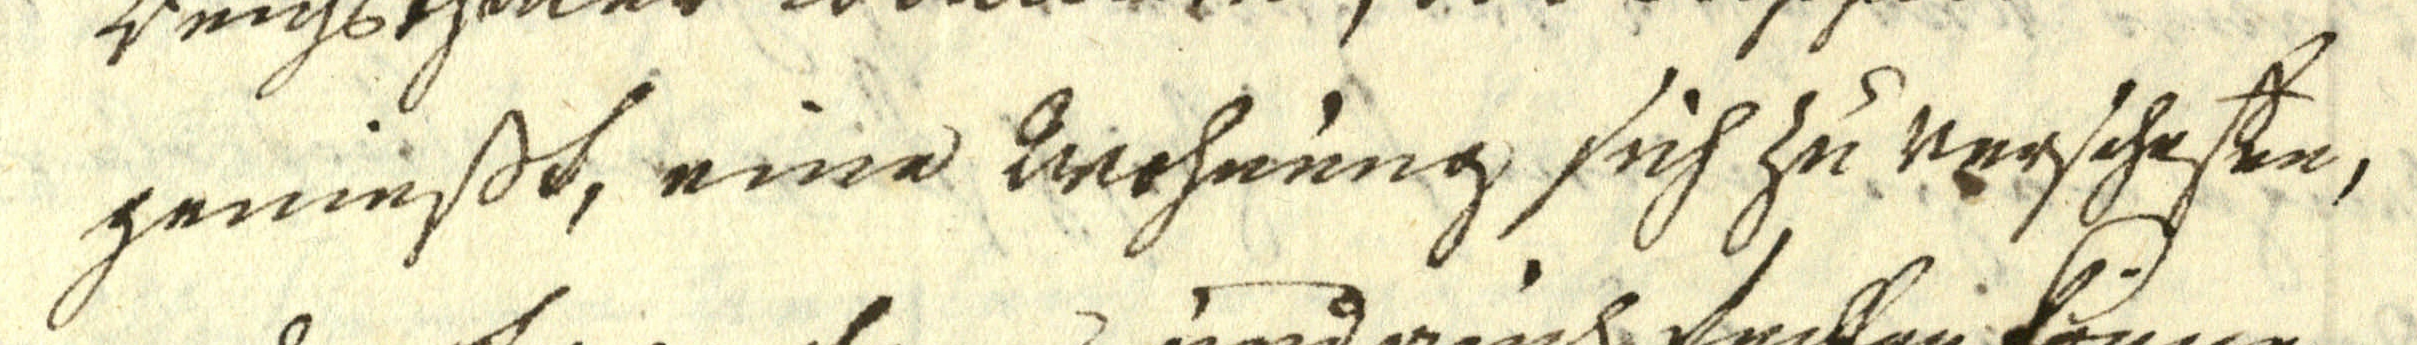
genießt, eine Wohnung sich zu verschaffen,
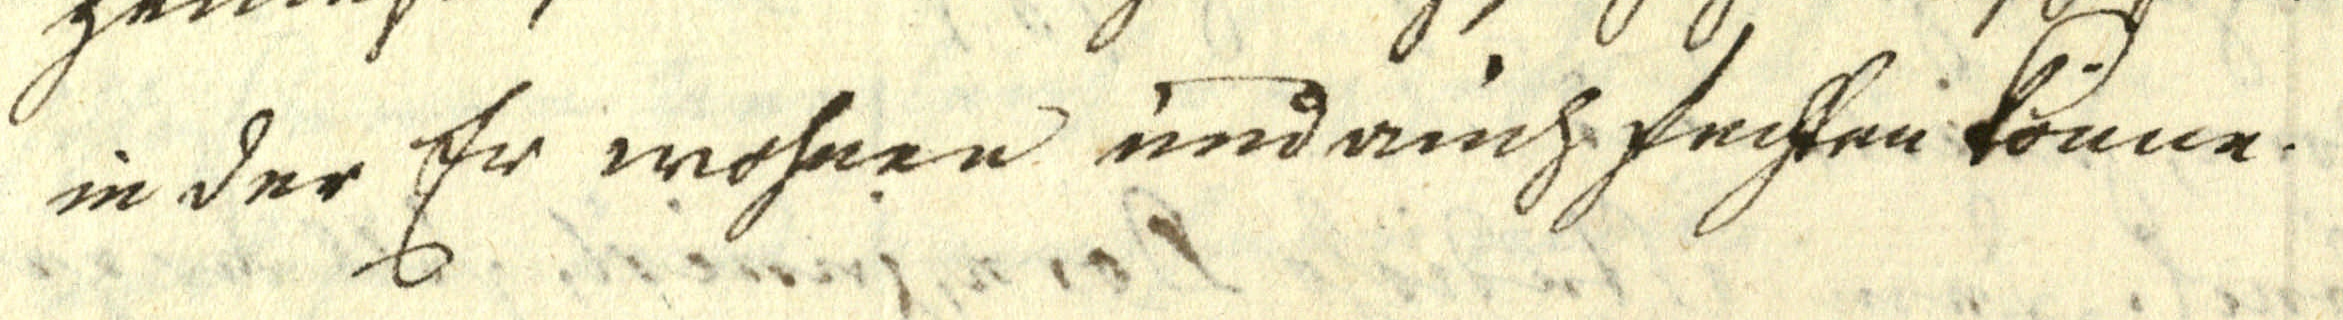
in der Er wohnen und auch fechten könne.
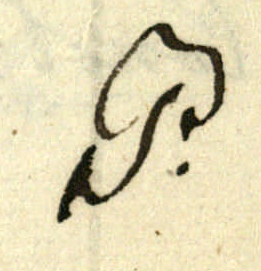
P.
